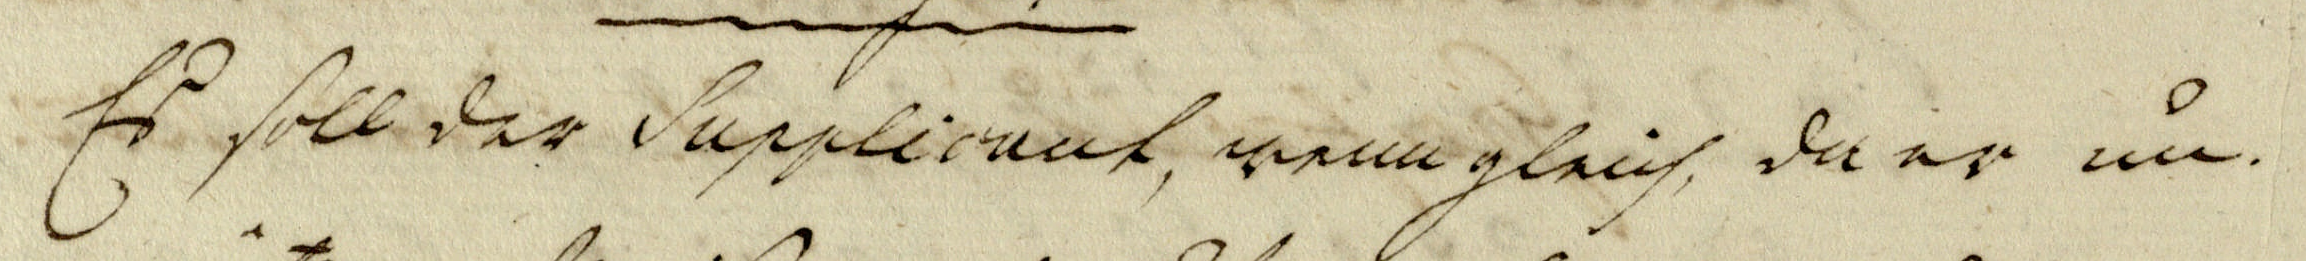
Es soll der Supplicant, wenngleich, da er un¬
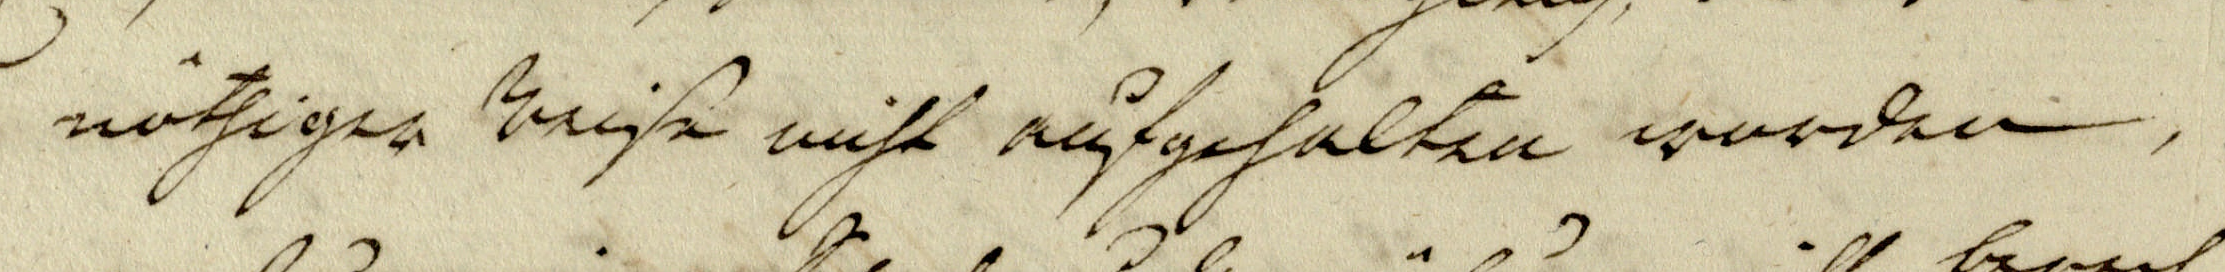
nöthiger Weise nicht aufgehalten worden,
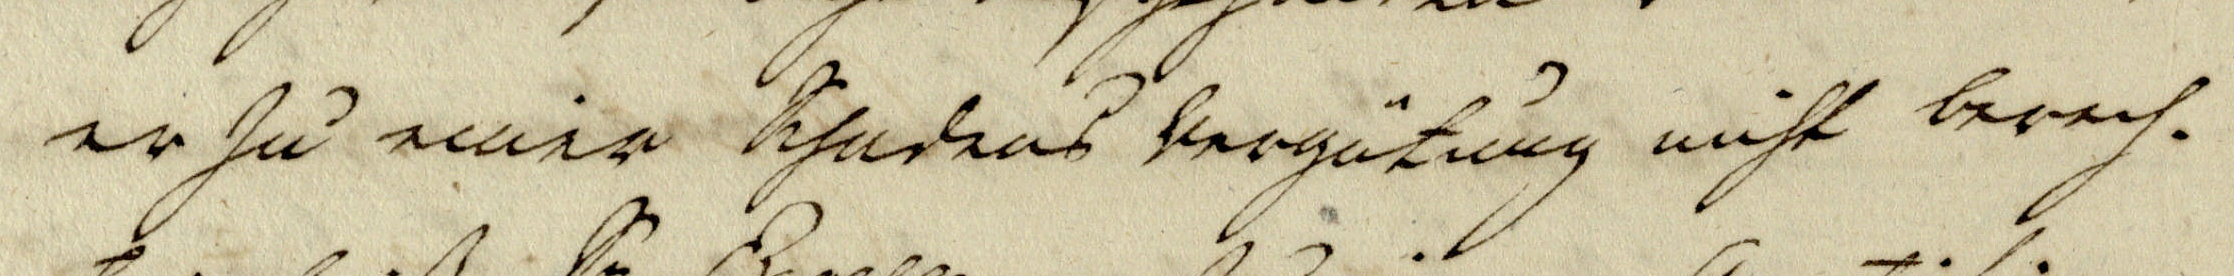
er zu einer Schadens Vergütung nicht berech¬
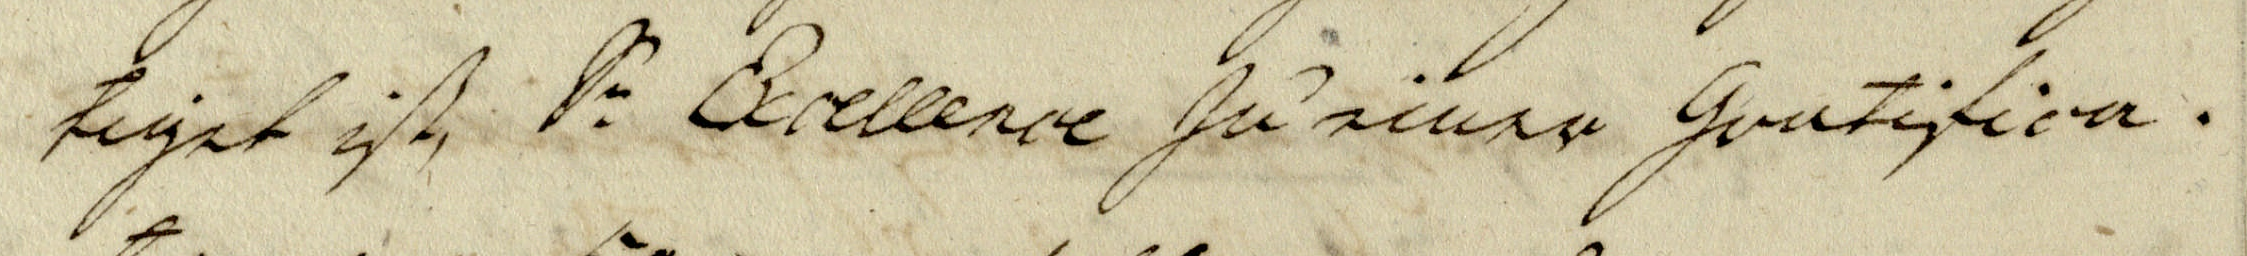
tiget ist, Sr Excellence zu einer Gratifica¬
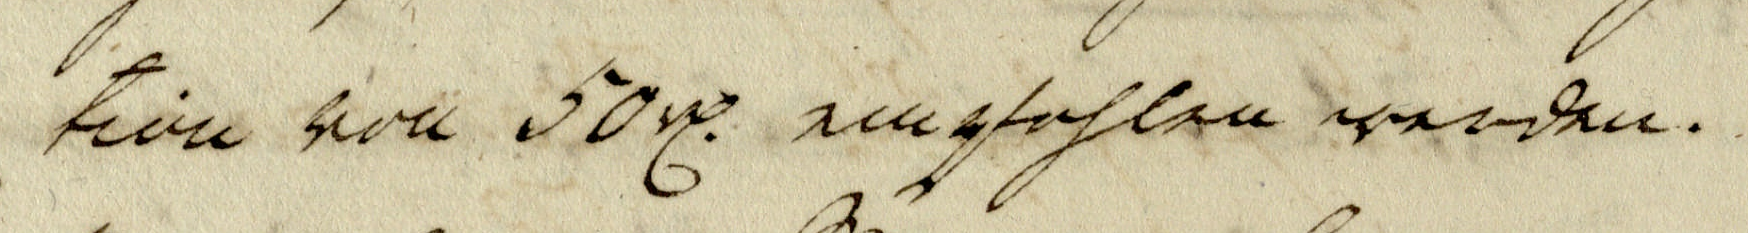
tion von 50 rl. empfohlen werden.
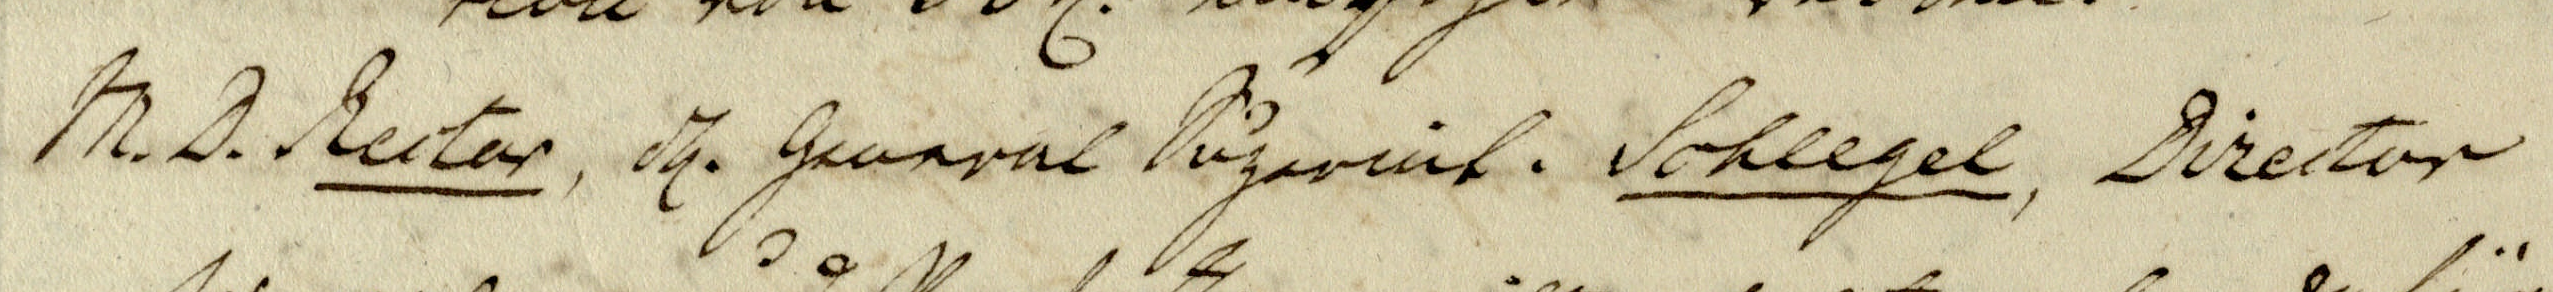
M. D. Rector, dh. General Superint. Schlegel, Director
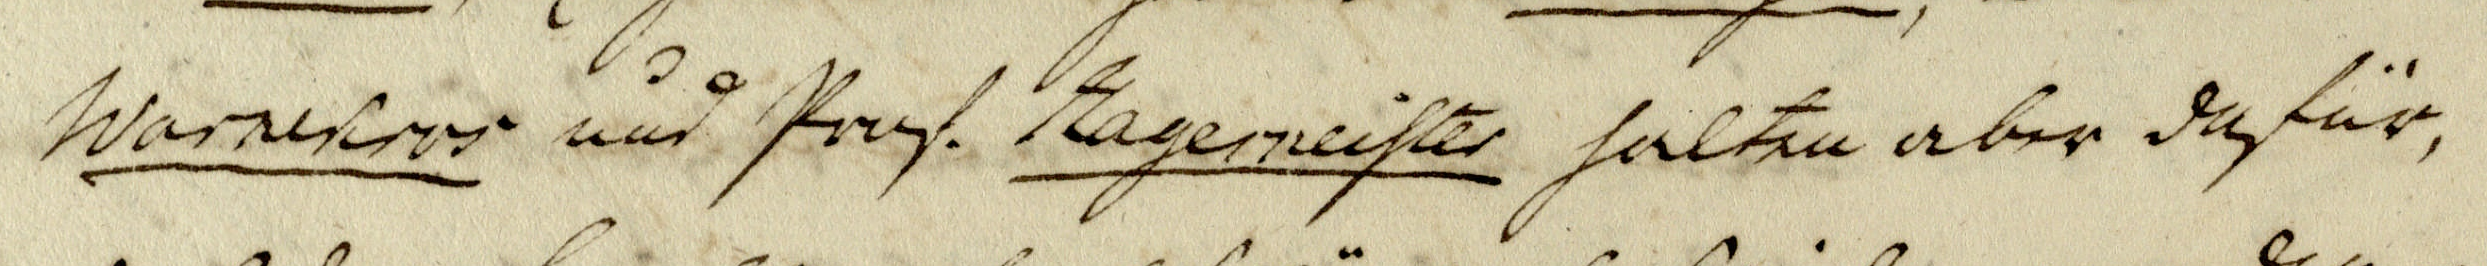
Warnekros und Prof. Hagemeister halten aber dafür,
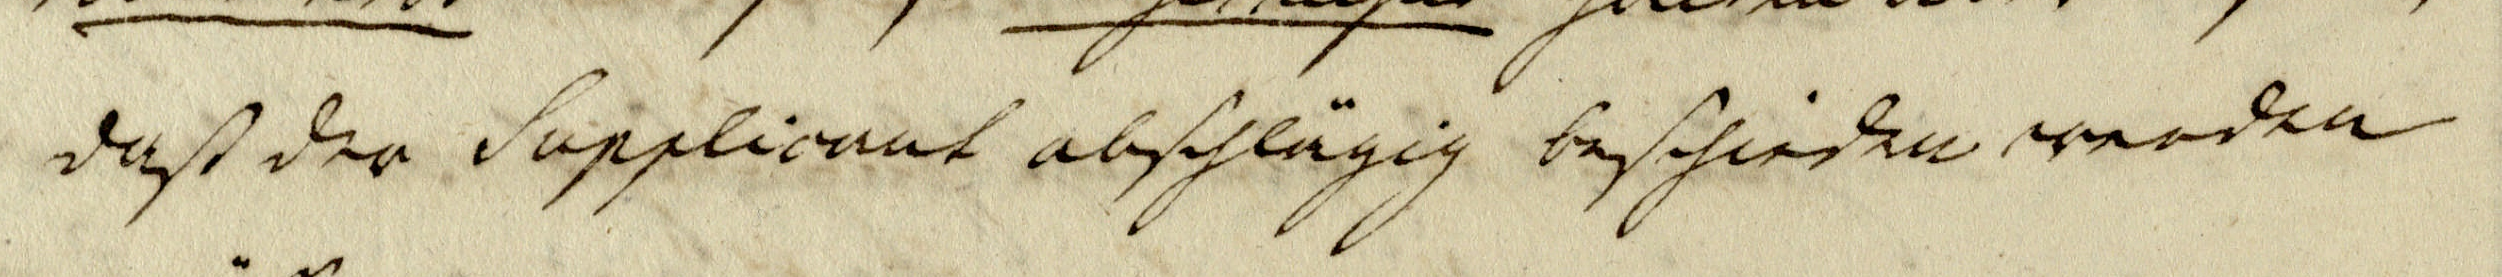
daß der Supplicant abschlägig beschieden werden
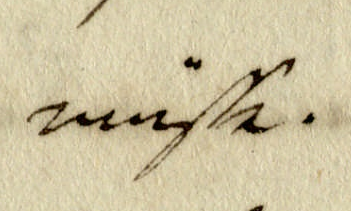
müsse.
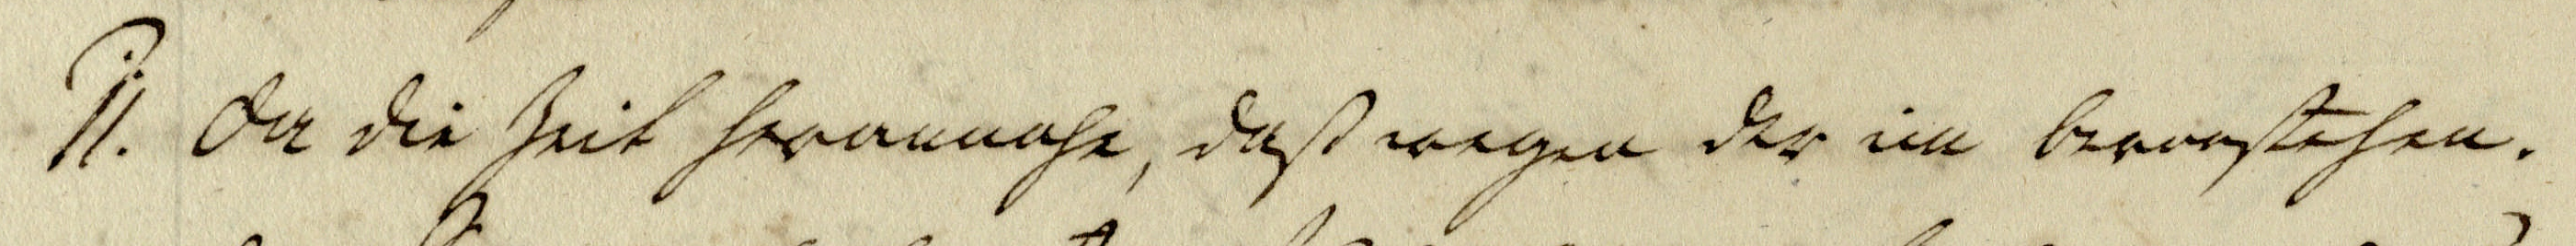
11. Da die Zeit herannahe, daß wegen der im bevorstehen¬
